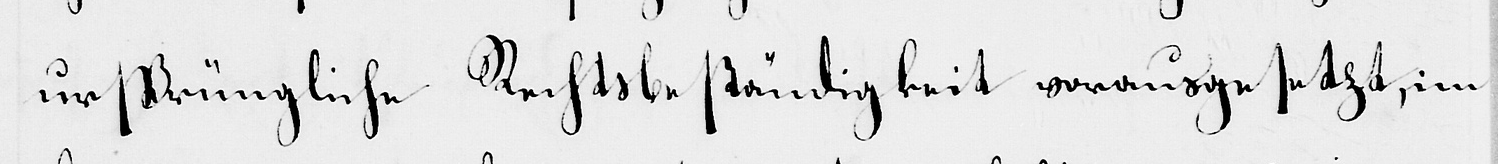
ursprüngliche Rechtsbeständigkeit vorausgesetzt, im
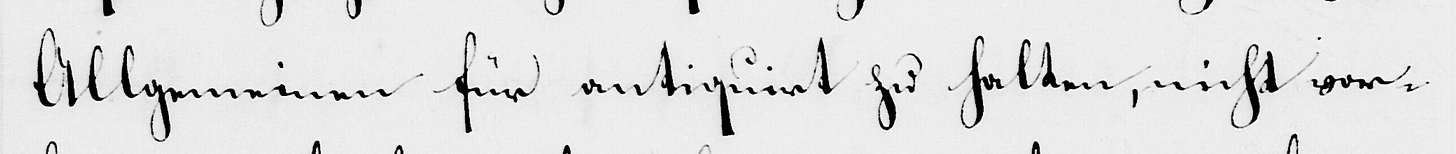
Allgemeinen für antiquirt zu halten, nicht vor¬
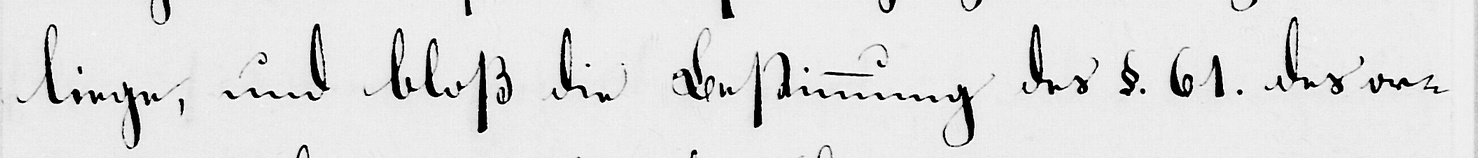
liege, und bloß die Bestimmung des §. 61. des or¬
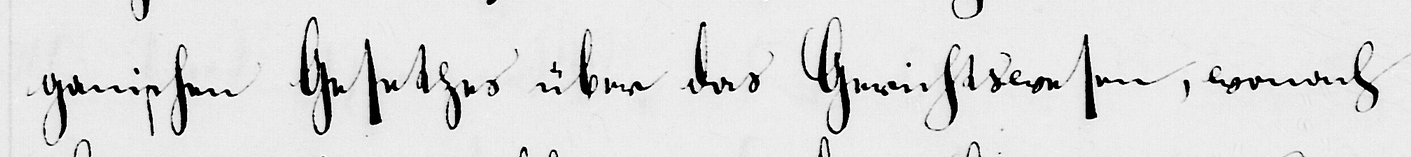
ganischen Gesetzes über das Gerichtswesen, wonach
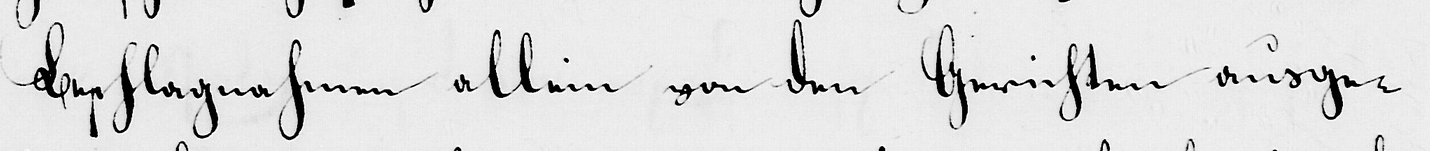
Beschlagnahmen allein von den Gerichten ausge¬
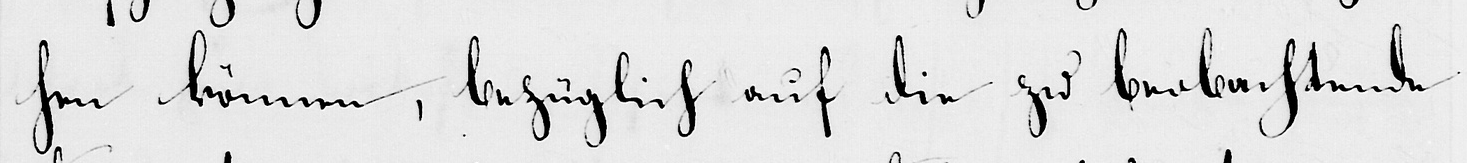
hen können, bezüglich auf die zu beobachtende
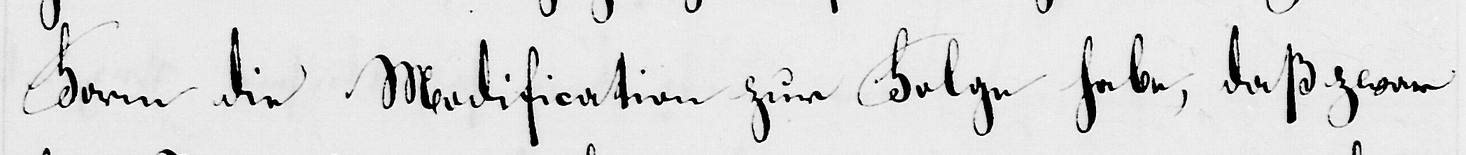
Form die Modification zur Folge habe, daß zwar
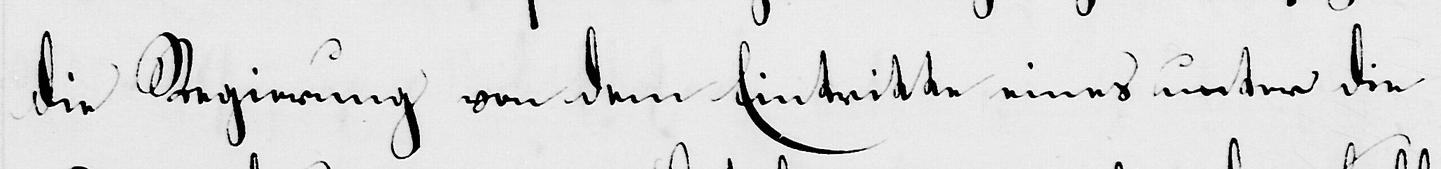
die Regierung von dem Eintritte eines unter die
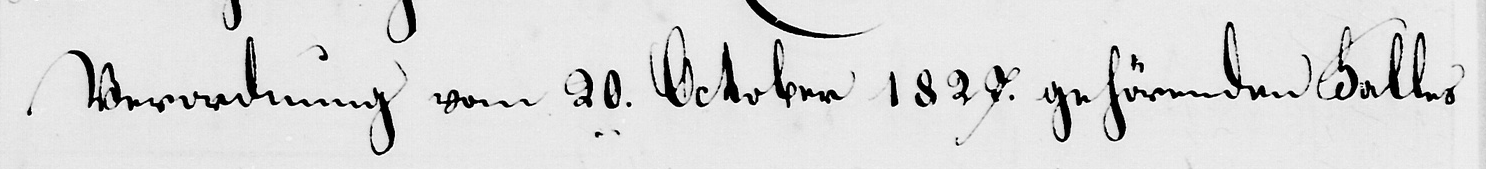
Verordnung vom 20. October 1827. gehörenden Falles
